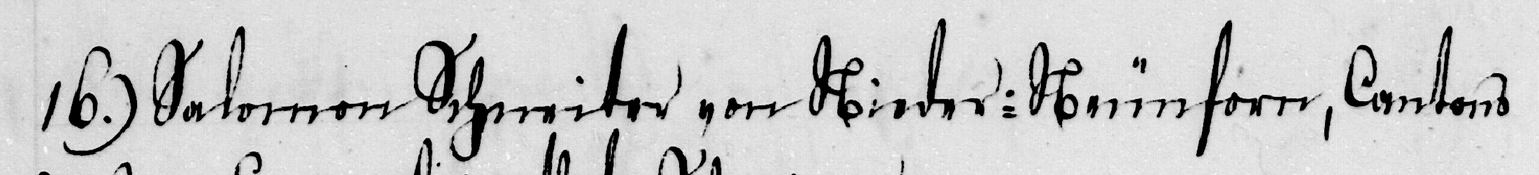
16.) Salomon Schneiter von Nieder-Neunforn, Cantons
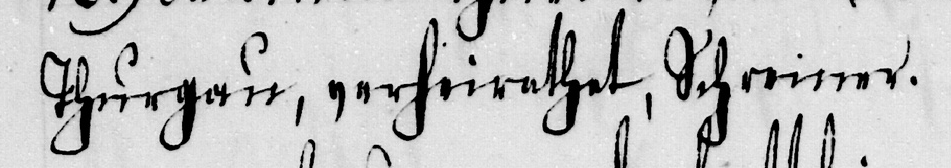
Thurgau, verheirathet, Schreiner.
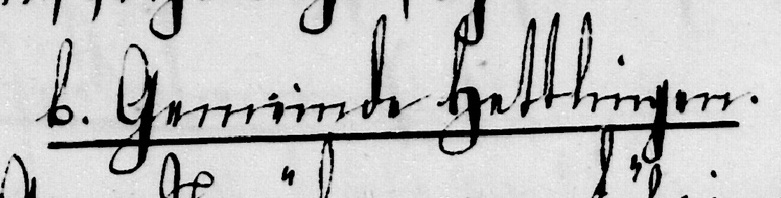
b. Gemeinde Hettlingen.
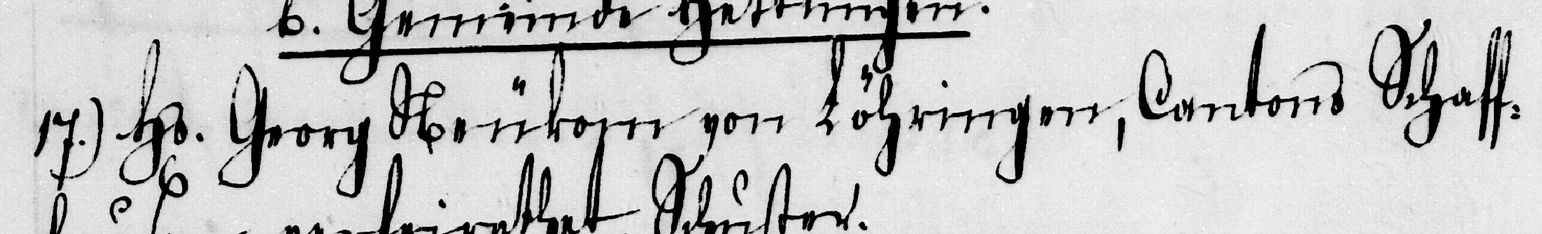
17.) Hs. Georg Neukom von Löhringen, Cantons Schaff¬
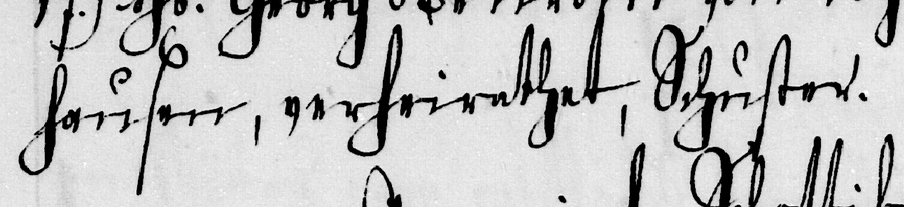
hausen, verheirathet, Schuster.
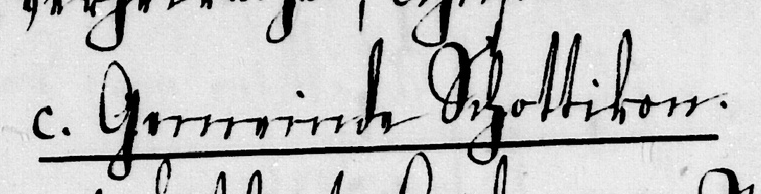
c. Gemeinde Schottikon.
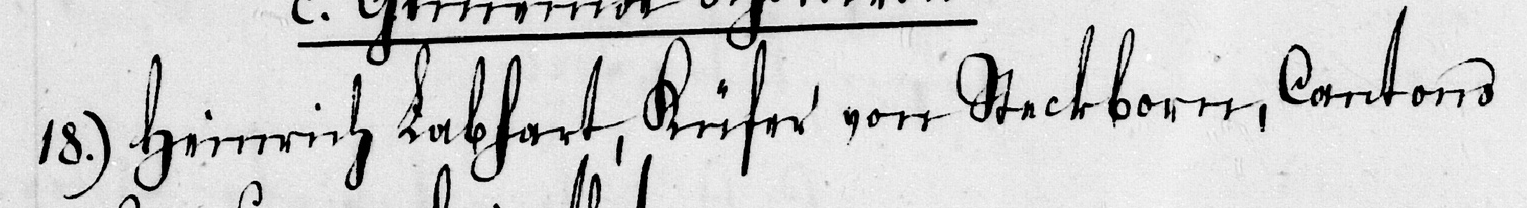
18.) Heinrich Labhart, Küfer von Steckborn, Cantons
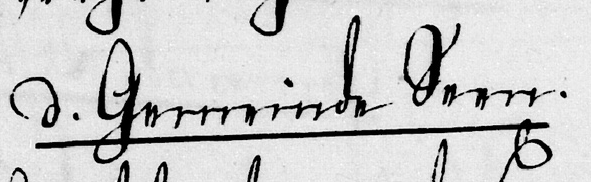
d. Gemeinde Seen.
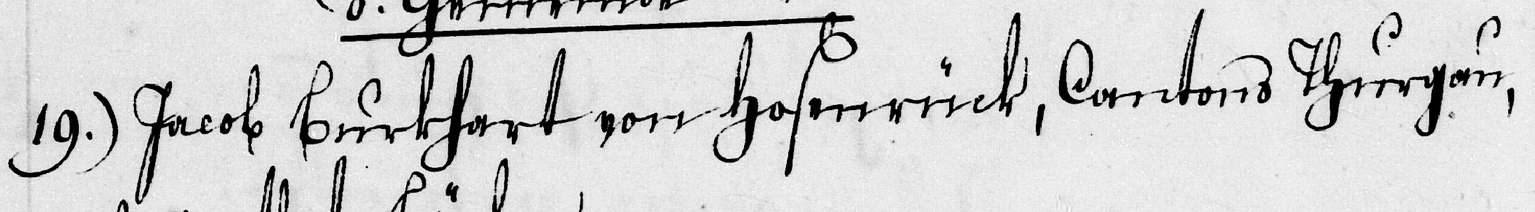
19.) Jacob Burkhart von Hosenrück, Cantons Thurgau,
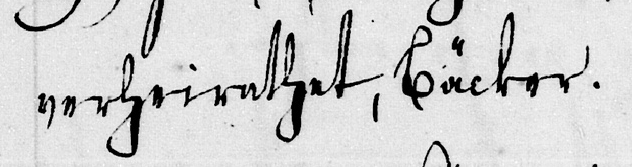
verheirathet, Bäcker.
